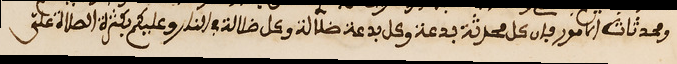ىومحدثاث الامور فان كل محدثة بدعة وكل بدعة ضلالة وكل ضلالة في النار وعليكم بكثرة الصلاة علي
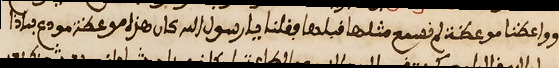وواعظنا موعظة لم نسمع مثلها قبلها فقلنا يا رسول الله كان هذه موعظة مودع بماذا
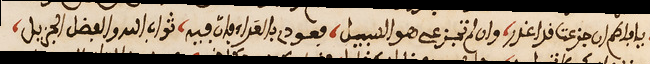يافاطم ان جزعت قد اعذر وان لم تجزعى هو السبيل فعودى بالعراء فان فيه ثواب الله والفضل الجزيل
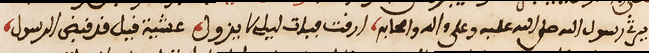يرثى رسول الله صلى اللع عليه وعلى ءاله واصحابه ارقت فبات ليلى لا يزول عشية قيل قد قبض الرسول
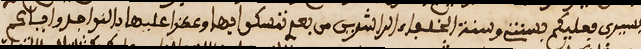فسيرى فعليكم بسنتى وسنة الخلفاء الراشدين من بعدى تمسكوا بها وعظوا عليها بالنواجد واياكم
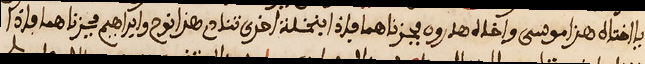يا اختاه هذا موسى واخاه هارون فجزناهما فاذا بنخلة اخرى تنادى هذا نوح وابراهيم فجزناهما فاذا
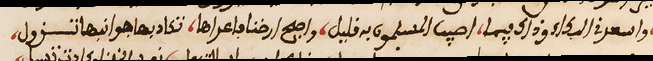واسعدنى البكاء وذاك فيما اصيب المسلمون به قليل واصبح ارضنا فاعراها تكاد بها جوانبها تزول
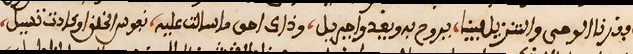فقدنا الوحى والتنزيل فينا يروح به ويغدوا جبريل وذاك احق ما سالت عليه نفوس الخلق او كادت تسيل
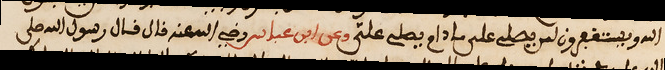الله ويستغفرون لمن يصلى على ما دام يصلى على وعن ابن عباس رضي الله عنه قال قال رسول الله صلى
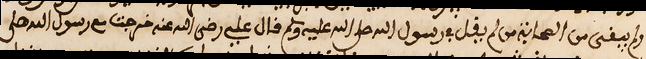ولم يبقى من الصحابة من لم يقل في رسول الله صلى الله عليه وسلم قال علي رضى الله عنه خرجت مع رسول الله صلى
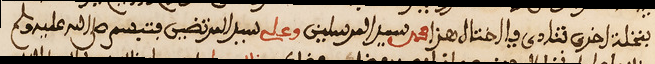بنخلة اخرى تنادى يا اختاه هذا محمد سيد المرسلين وعلى سيد المرتضين فتبسم صلى الله عليه وسلم
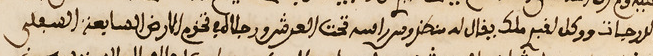الدرجات ووكل لفبرى ملك يقال له منظروس راسه تحت العرش ورجلاه في تخوم الارض السابعة السفلى
